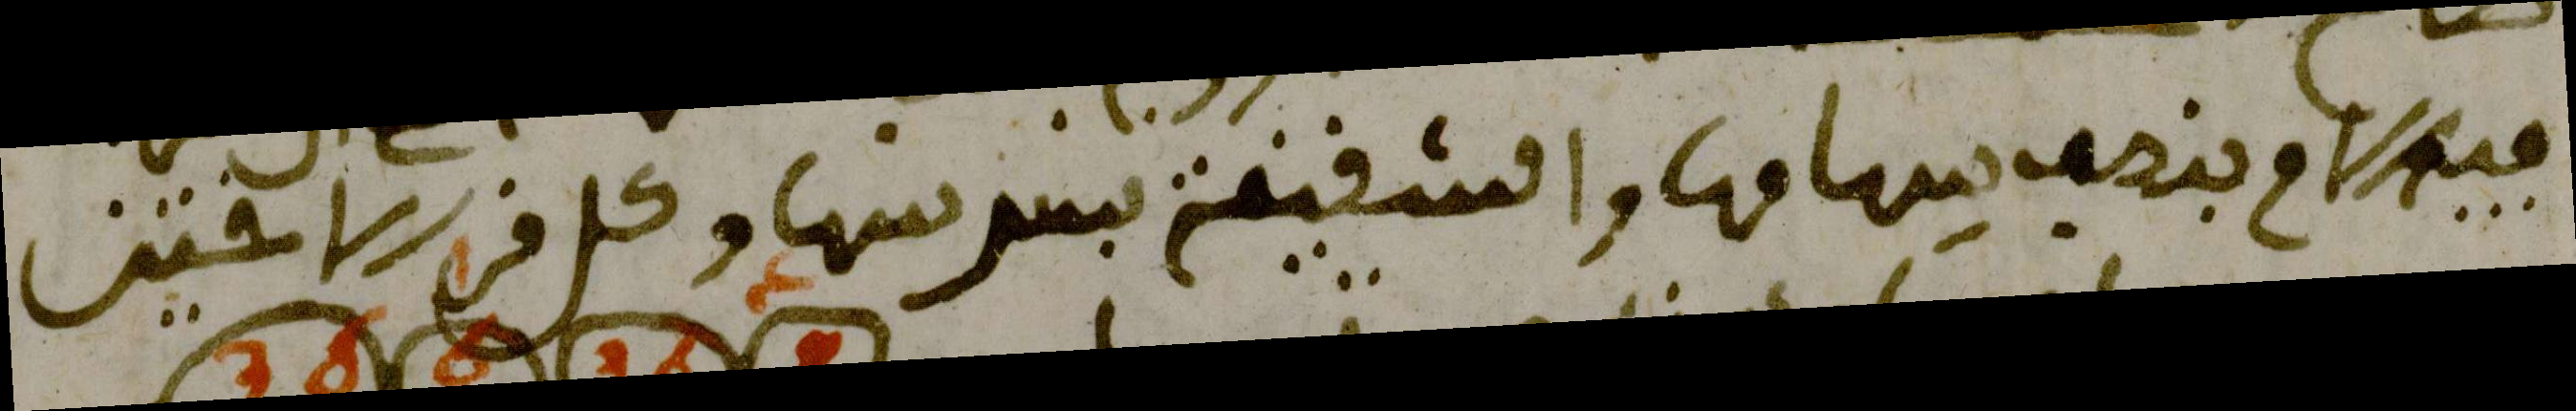فيه الام بنصف سِهامها والشقيقة بسدسها وكل من الاختين
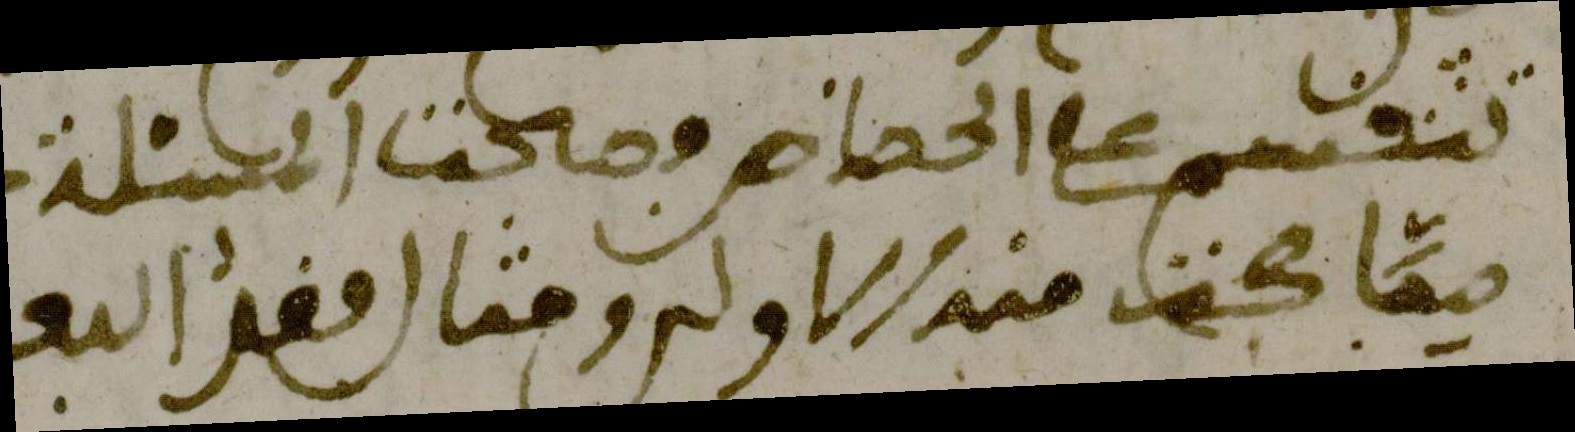تتقسم على الحصاص فصحت المسْلة
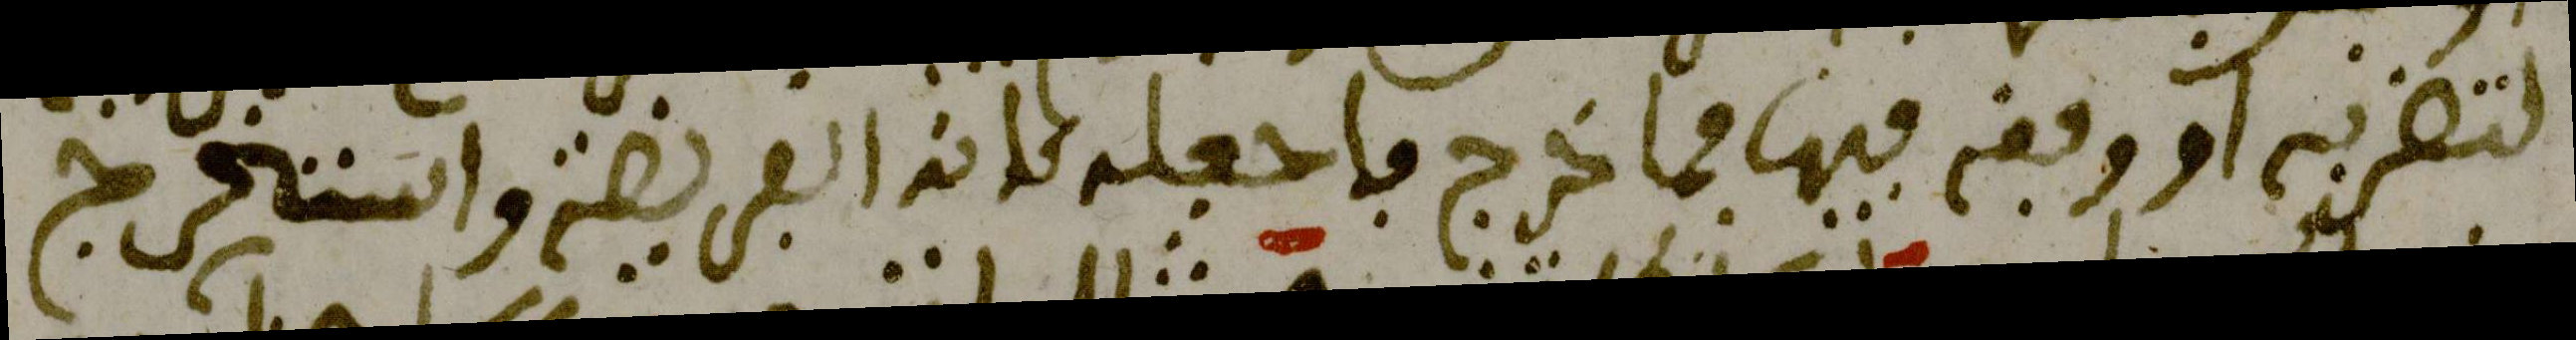لتضربه او وقفه فيها فما خرج فاجعله كانه الفريضة واستخرج
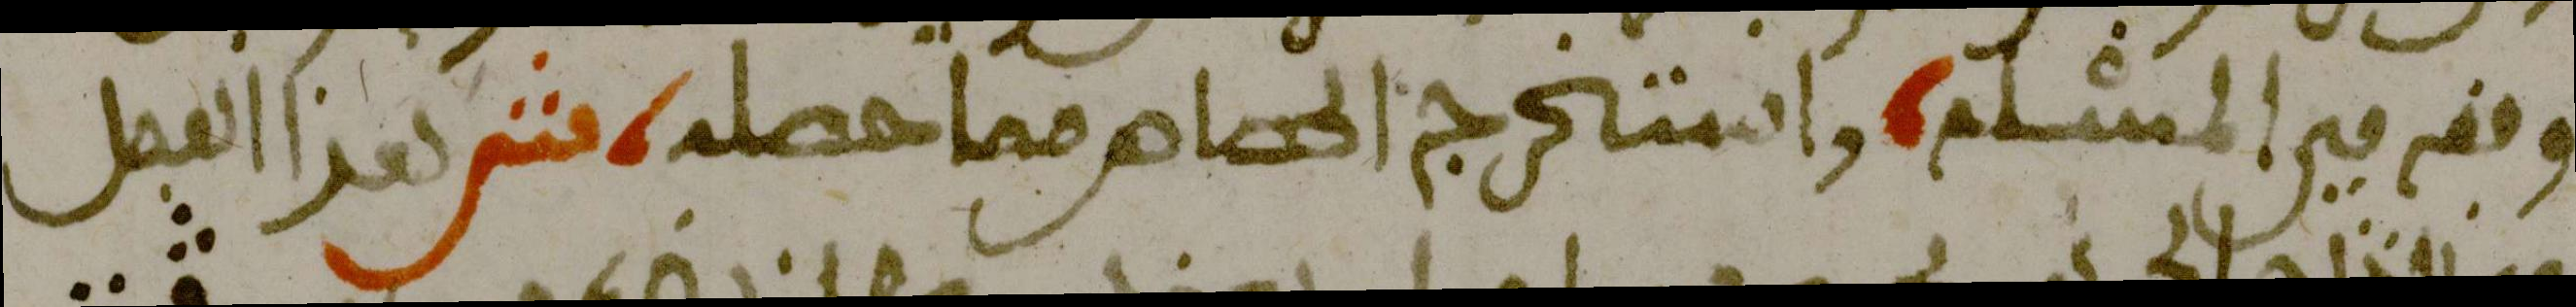وفقه في المسْلة واستخرج الحصاص مما حصله ش هذا الفصل
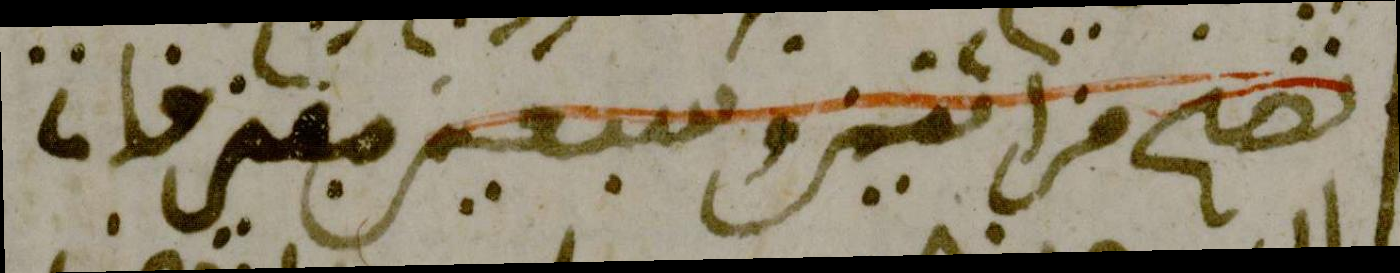تصح من اثنين وسبعين مفترقات
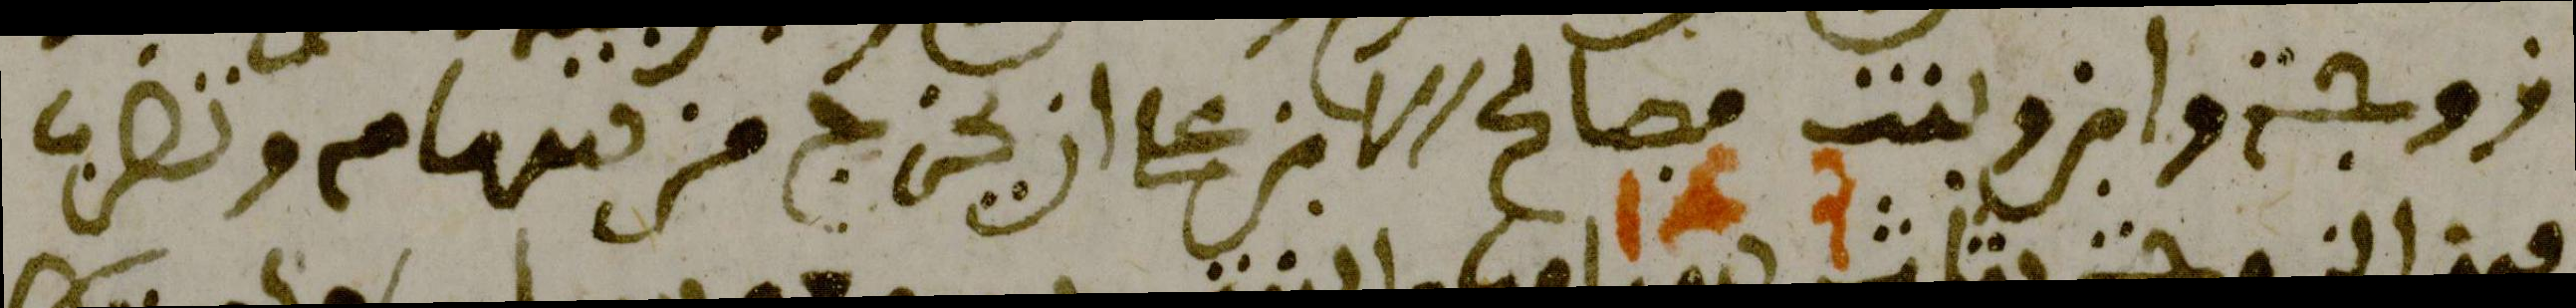زوجة وابن وبنت فصالح الابن على ان يخرج من سهامه وتضرب
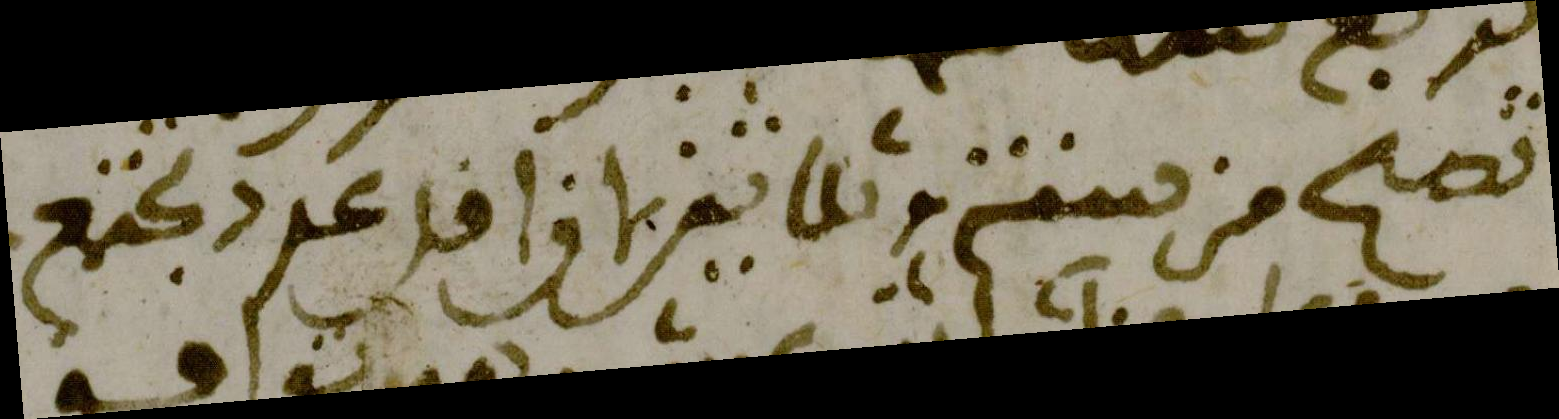تصح من ستة وثلاثين لان اقل عدد تجتمع
